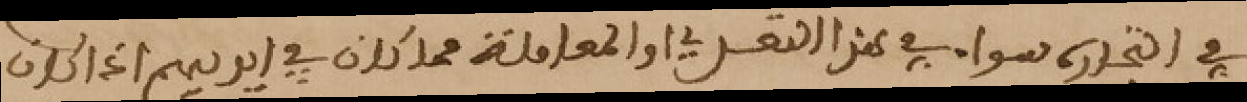في اتجاره سواء في هذا التعدي او المعاملة مما كان في ايديهم اذا كان
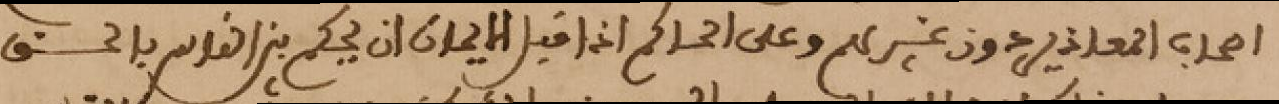اصحاب المعاذ يردون غيرهم وعلى الحاكم اذا قبل الايمان ان يحكم بين الناس بالحق
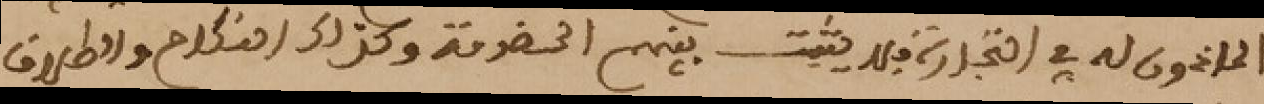الماذون له في التجارة فلا يثبت بينهم الخصومة وكذلك النكاح والطلاق
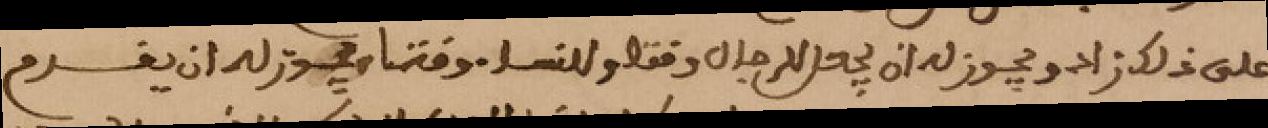على ذلك زاد ويجوز له ان يجعل للرجال وقتا وللنساء وقتا يجوز له ان يقدم
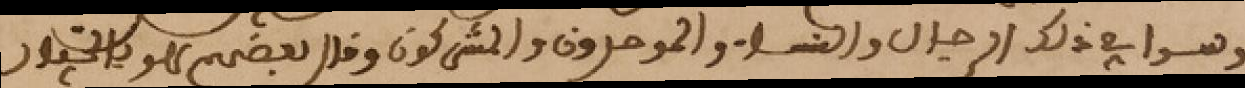وسوا في ذلك الرجال والنساء والموحدون والمشركون وقال بعضهم هو بالخيار
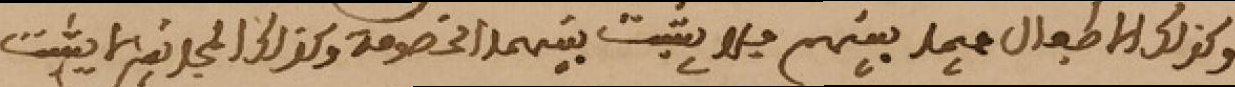وكذلك الاطفال فيما بينهم فلا يثبت بينهما الخصومة وكذلك المجانين لا يثبت
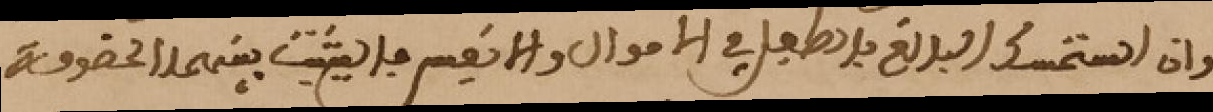وان استمسك البالغ بالطفل في الاموال والانفس فليثبت بينهما الخصومة
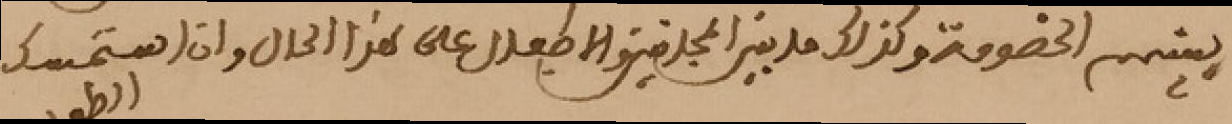بينهم الخصومة وكذلك ما بين المجانين والاطفال على هذا الحال وان استمسك
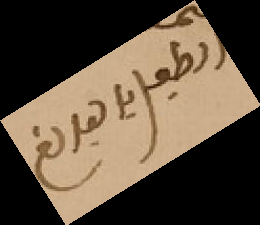الطفل بالبالغ
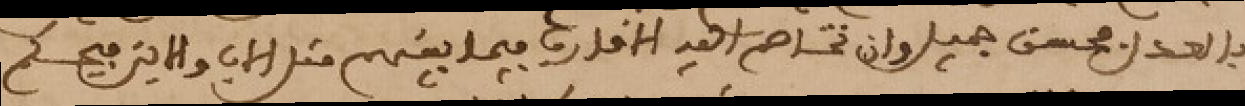بالعدل فحسن جميل وان تخاصم اليه الاقارب فيما بينهم مثل الاب والابن فيحكم
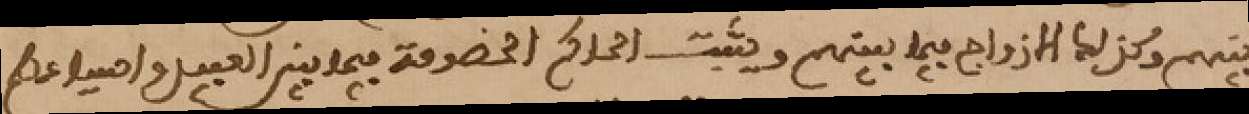بينهم وكذلك الازواج فيما بينهم ويثبت الحاكم الخصومة فيما بين العبيد واسيادهم
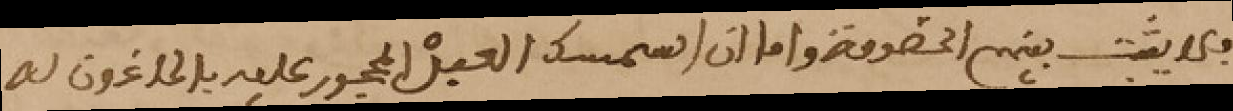فلا يثبت بينهم الخصومة واما ان استمسك العبد المحجور عليه بالماذون له
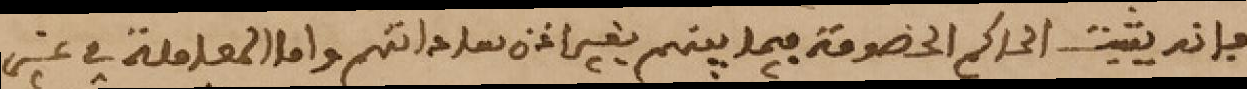فانه يثبت الحاكم الخصومة فيما بينهم بغير اذن ساداتهم واما المعاملة في غير
